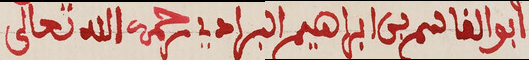ابو القاسم بن ابراهيم البرادي رحمه الله تعالى
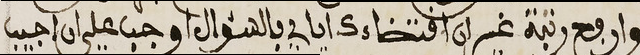وارفع رتبة غير ان اقتضاءك اياي بالسؤال اوجب علي ان اجيب
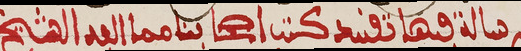رسالة فيها تقييد كتب اصحابنا مما الفه الشيخ
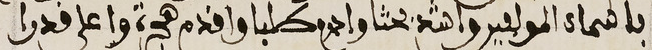باسماء المولفين واشد بحثا وادوم طلبا واقدم هجرة واعلى قدرا
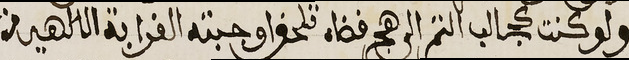ولو كنت كجالب التمر الى هجر قضاء تلحق اوجبته القرابة الالاهية
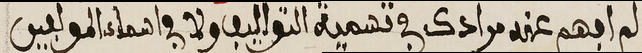لم افهم عنه مرادك في تسمية التواليف ولا في اسماء المولفين
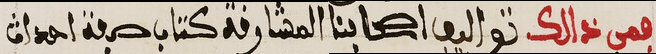فمن ذلك تواليف اصحابنا المشارقة كتاب صفة احداث
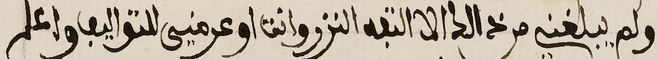ولم يبلغني من ذلك الا التفه النز وانت اوعر مني للتواليف واعلم
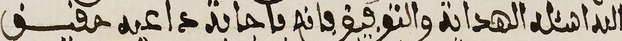الله اسئله الهداية والتوفيق فانه باجابة داعيه حقيق
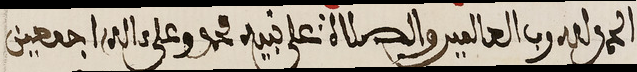الحمد لله رب العالمين والصلاة على نبيه محمد وعلى اله اجمعين
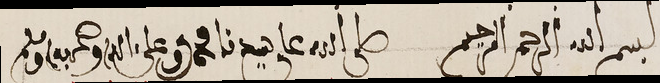بسم الله الرحمن الرحيم صلى الله على سيدنا محمد وعلى اله وصحبه وسلم
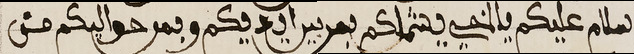سلام عليكم يا اخي يشملكم بمن بين ايديكم وبمن حواليكم من
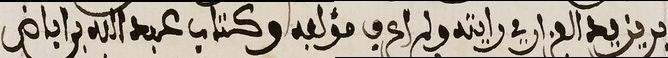بن يزيد الفزاري رايته ولم اعرف مؤلفه وكتاب عبد الله بن اباض
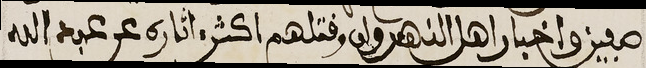صفين واخبار اهل النهروان وقتلهم اكثر ءاثاره عن عبد الله
